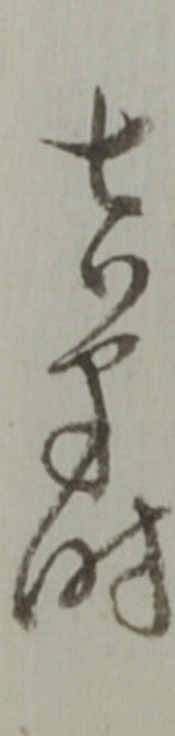四ツ半時
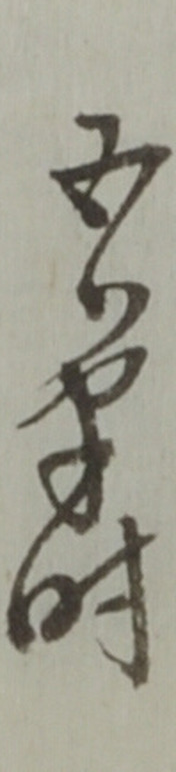四ツ半時
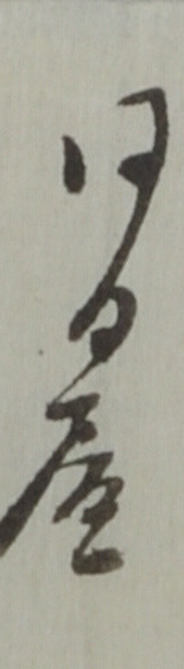同日昼
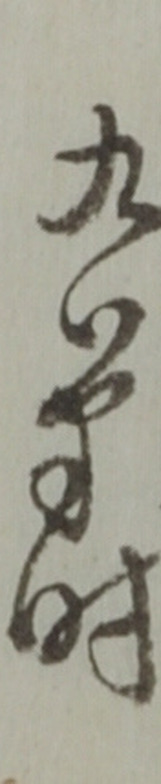四ツ半時
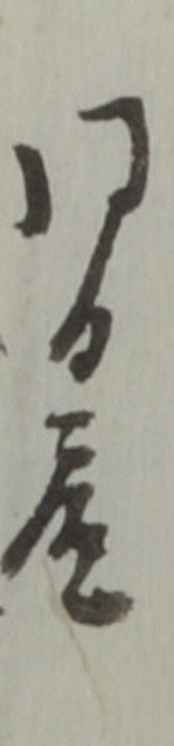同日昼
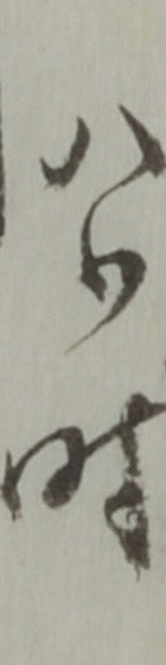八ツ時
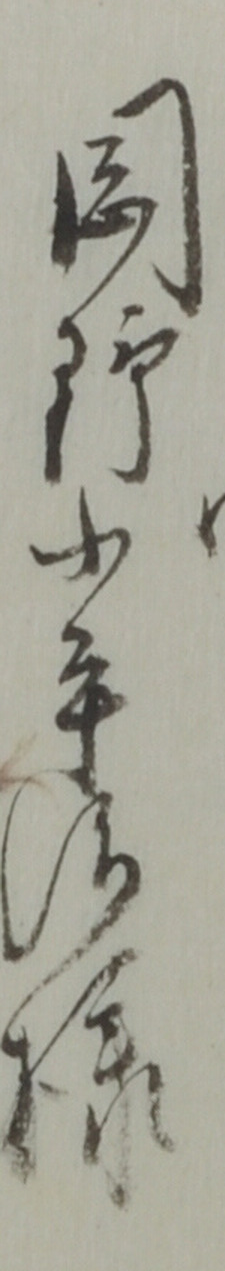岡野小平治様
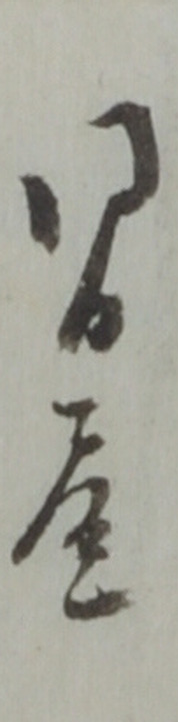同日昼
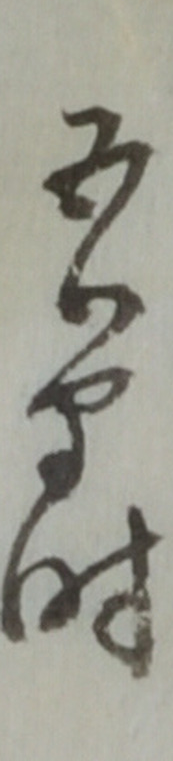四ツ半時

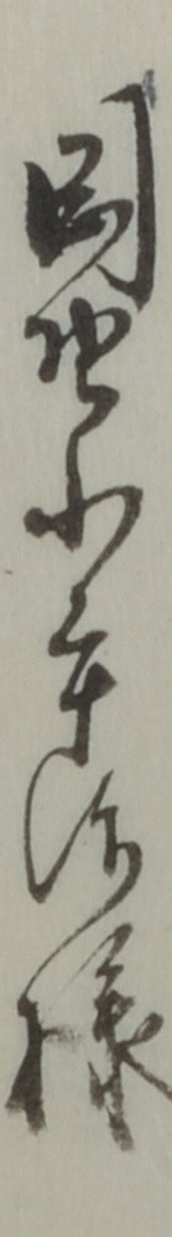岡野小平治様
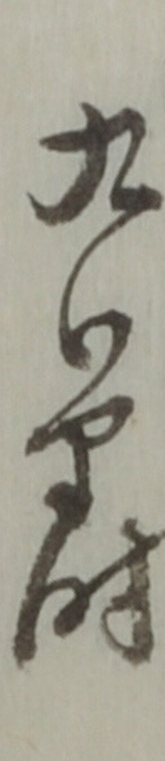四ツ半時
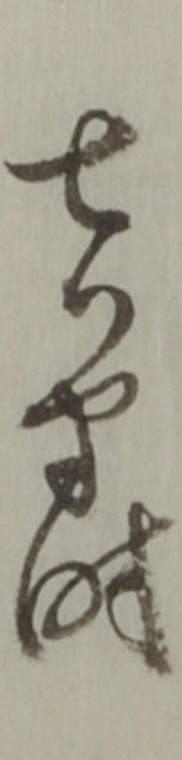四ツ半時
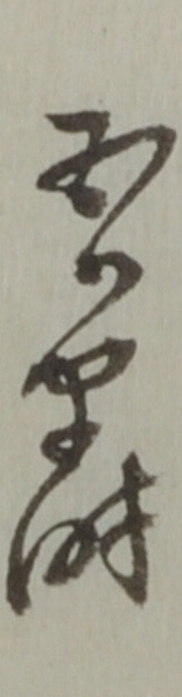四ツ半時
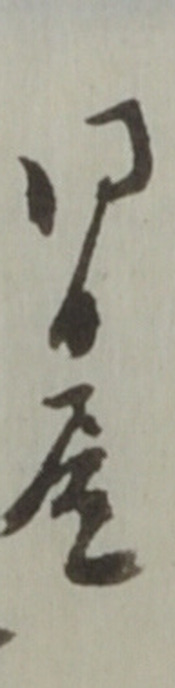同日昼
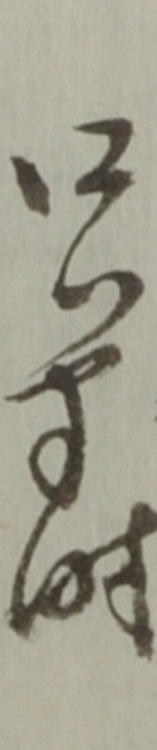四ツ半時
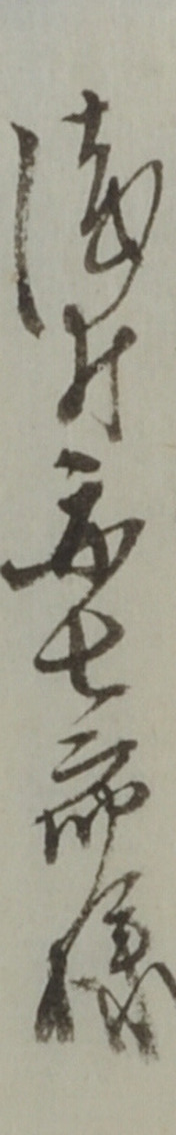浅井亦七郎様
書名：日光御参詣ニ付町方警固番割名前控
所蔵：伊那市立高遠町図書館・合同会社AMANE
